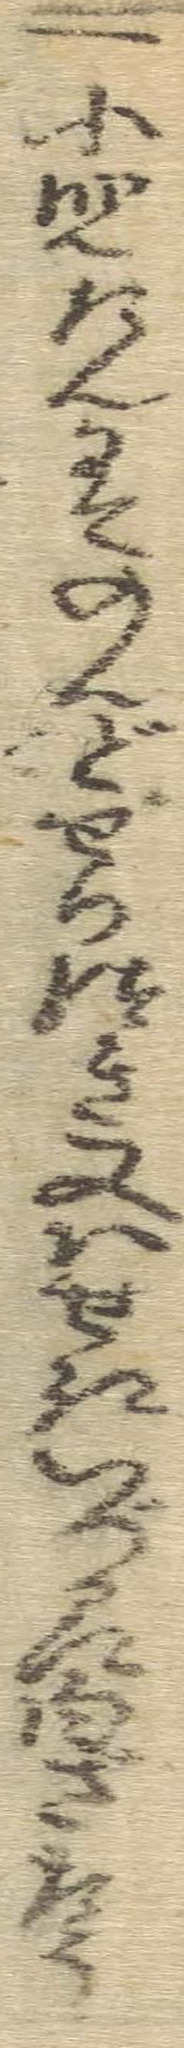一小児たんにてのんどせりつき又はせきいづるに白ざたう
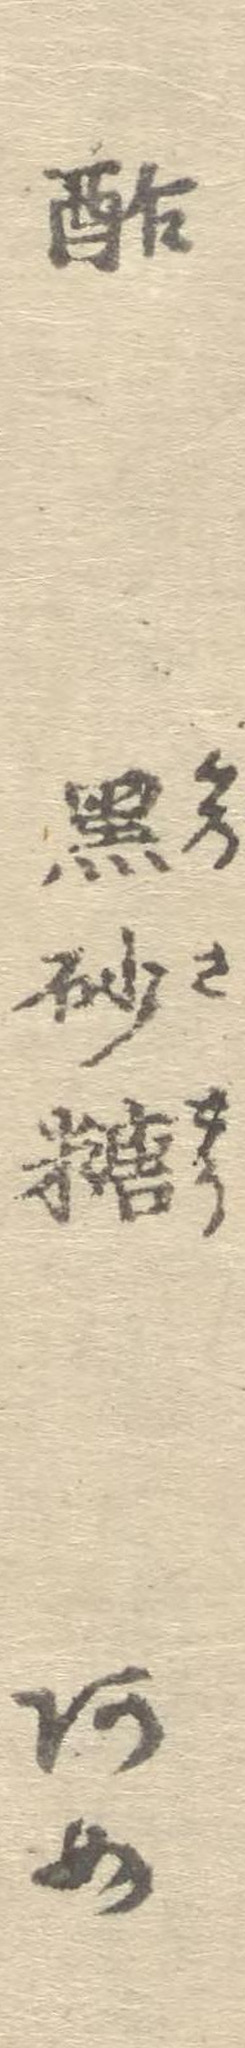酢黒砂糖あめ
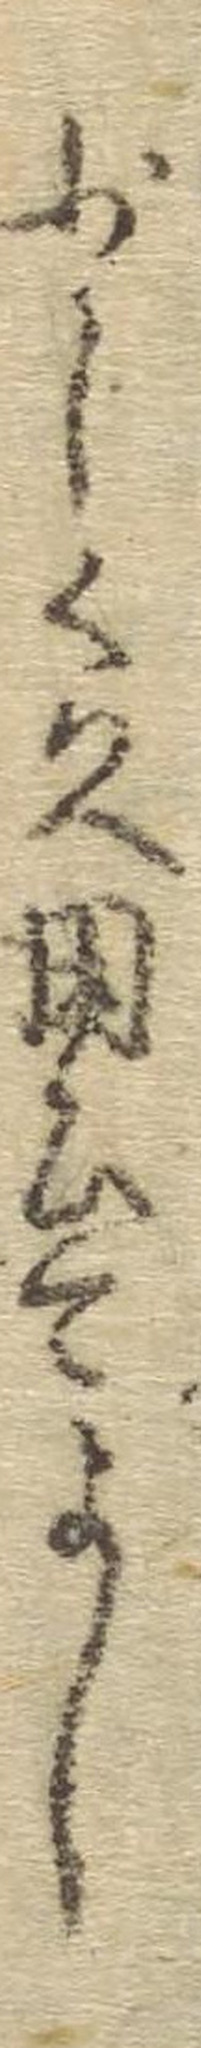少しくはへ用ひてよしす
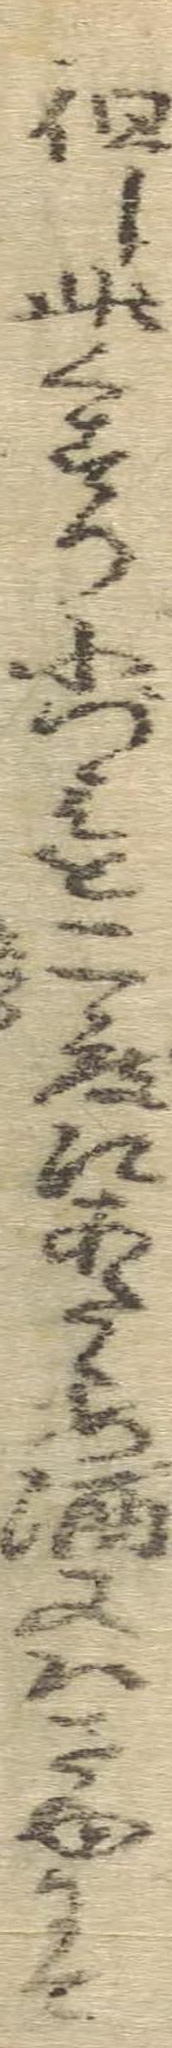但し此くすり小づゝみを二度にあたゝめ酒又はさゆにて
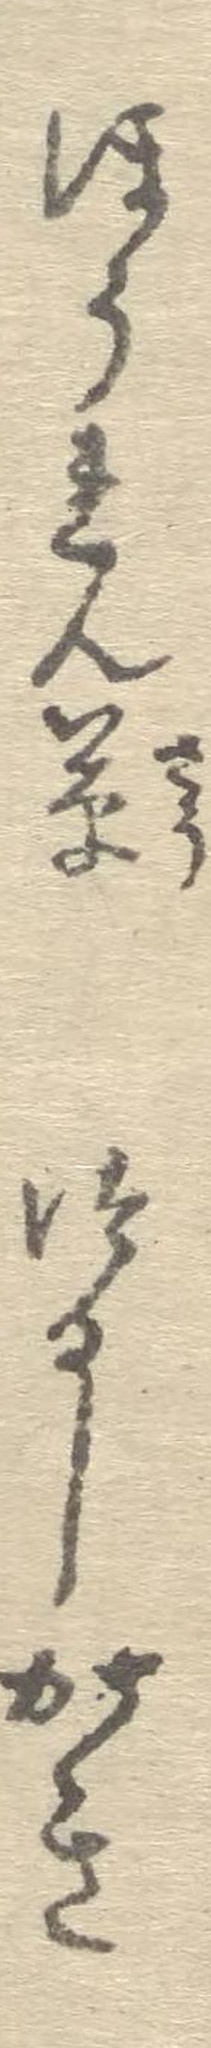ほうれん草つるしがき
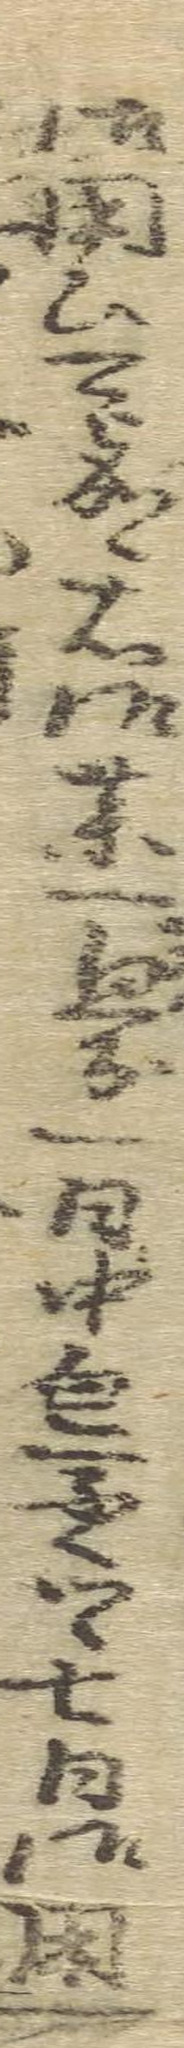御用ひ可被成候右御薬一廻分一日中包一ふくつゝ七日御用
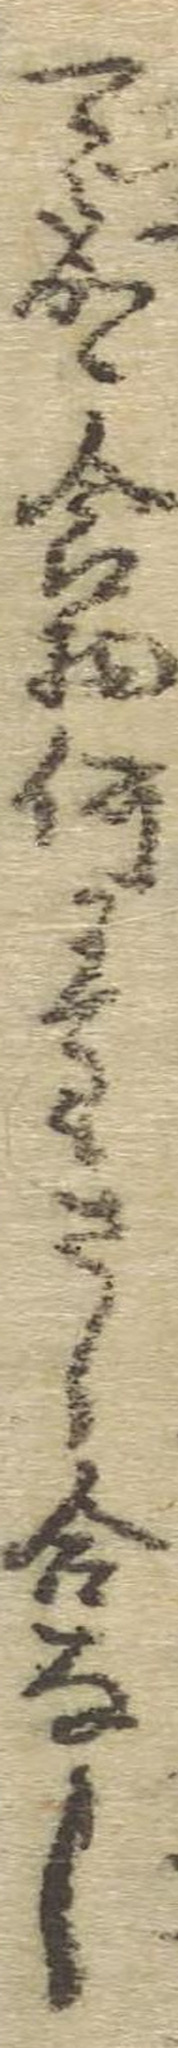可被成候食物何にてもさし合なし
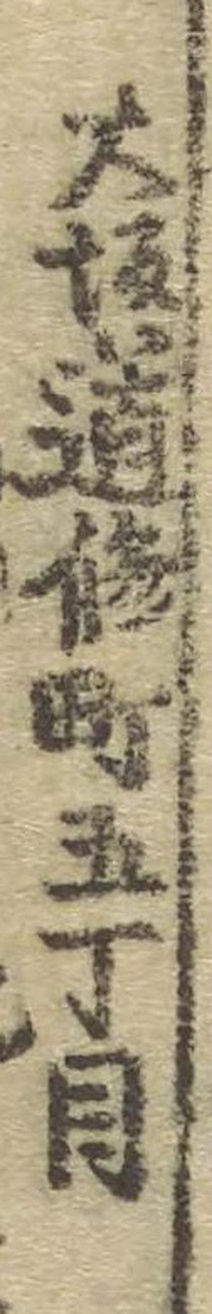大坂道修町五丁目
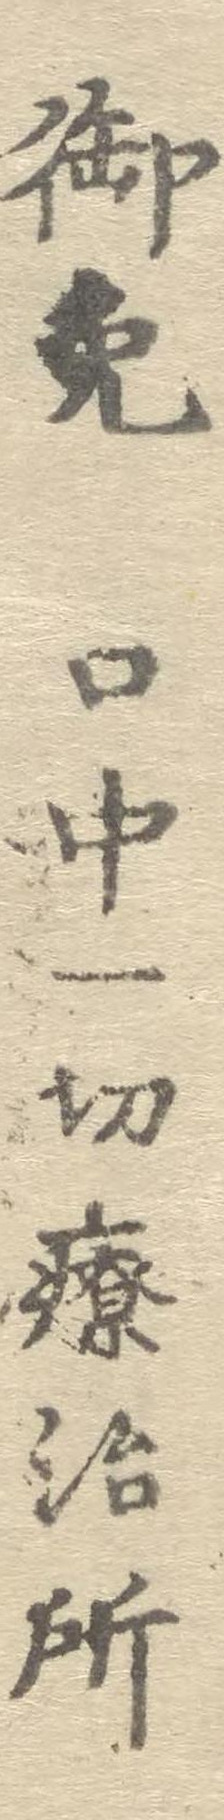御免口中一切療治所
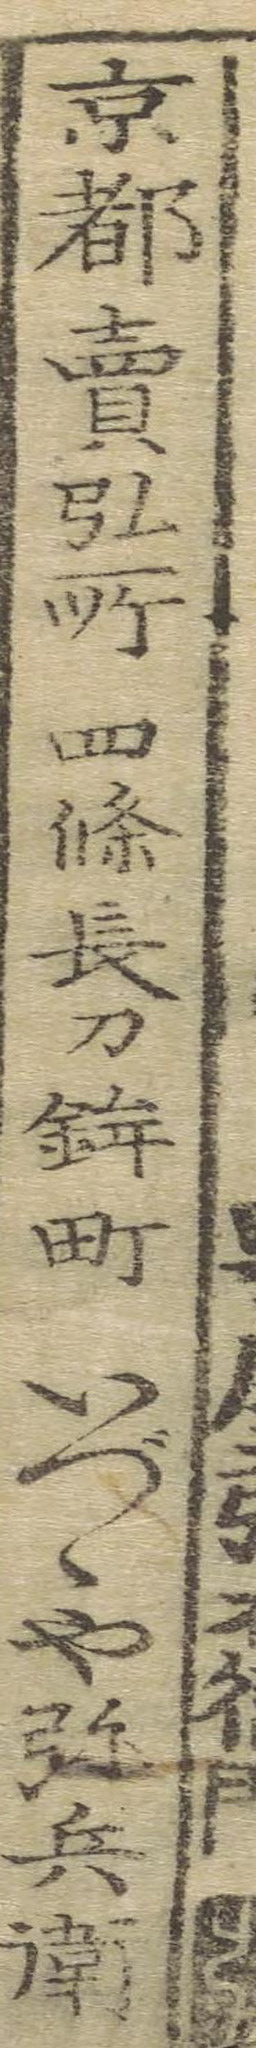京都売弘所四條長刀鉾町いづゝや弥兵衛
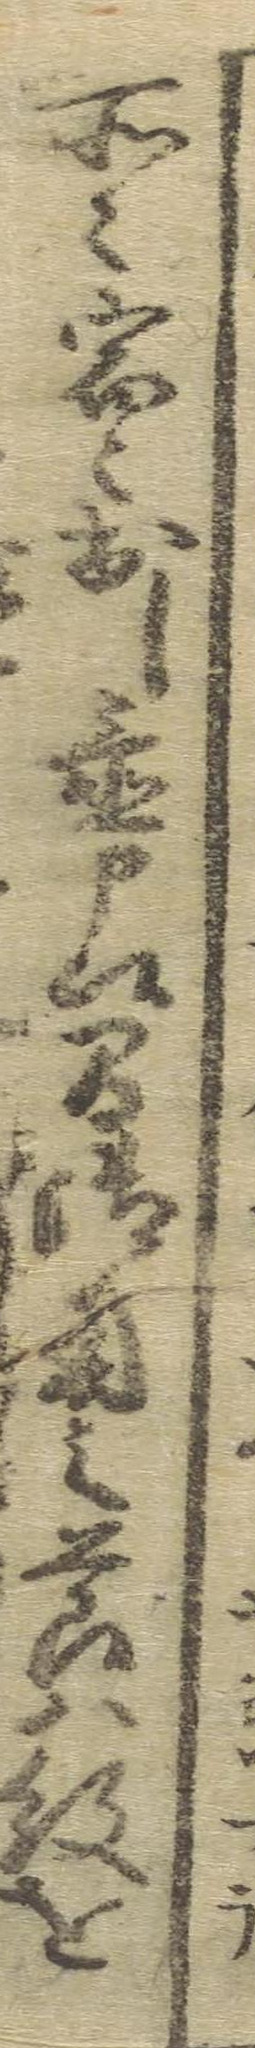所々宿々出し置申候間御用之節は紋を
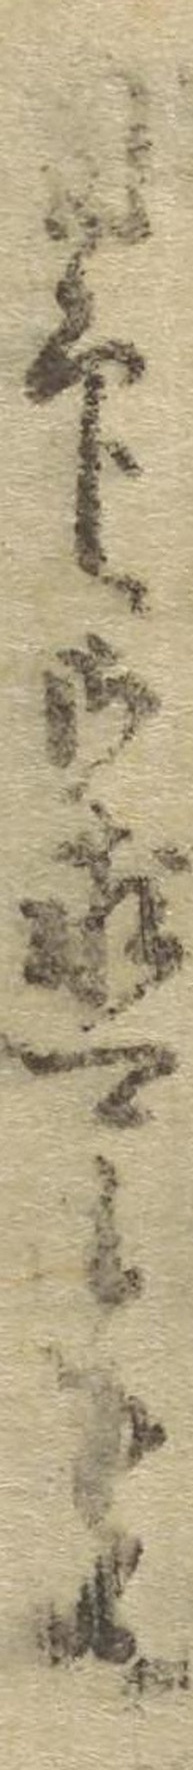目印に御求可被下候
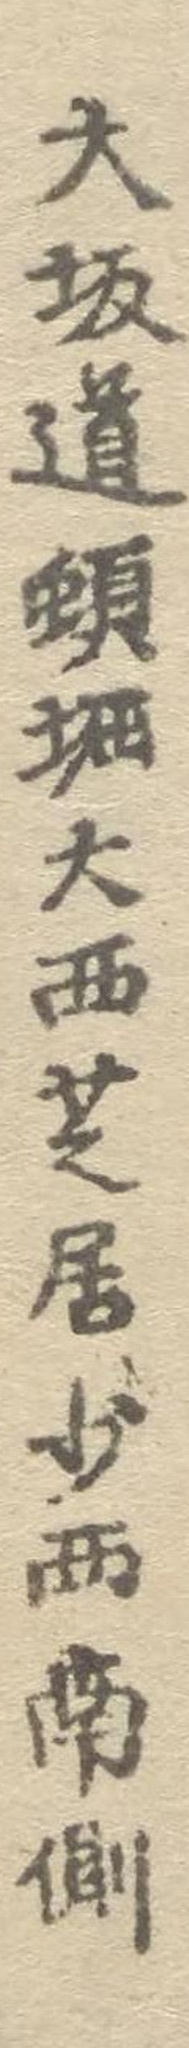大坂道頓堀大西芝居少西南側
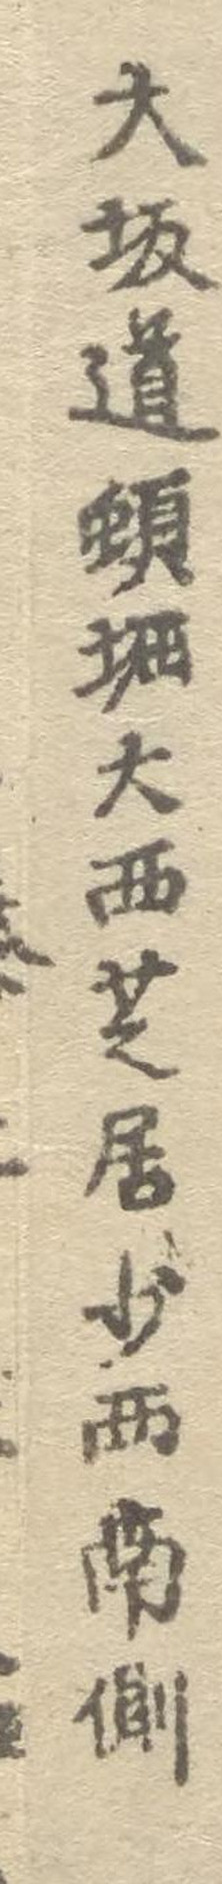大坂道頓堀大西芝居少西南側
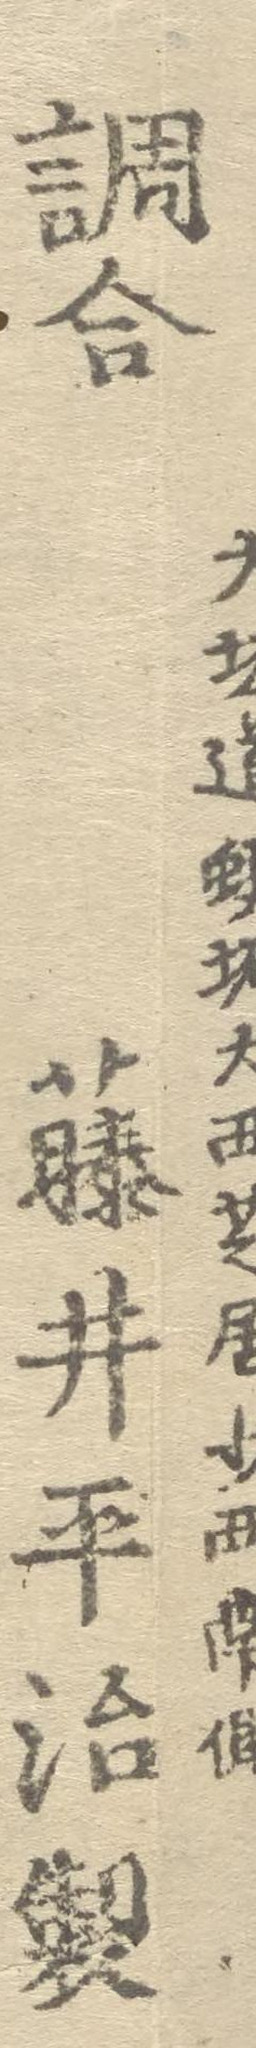調合藤井平治製
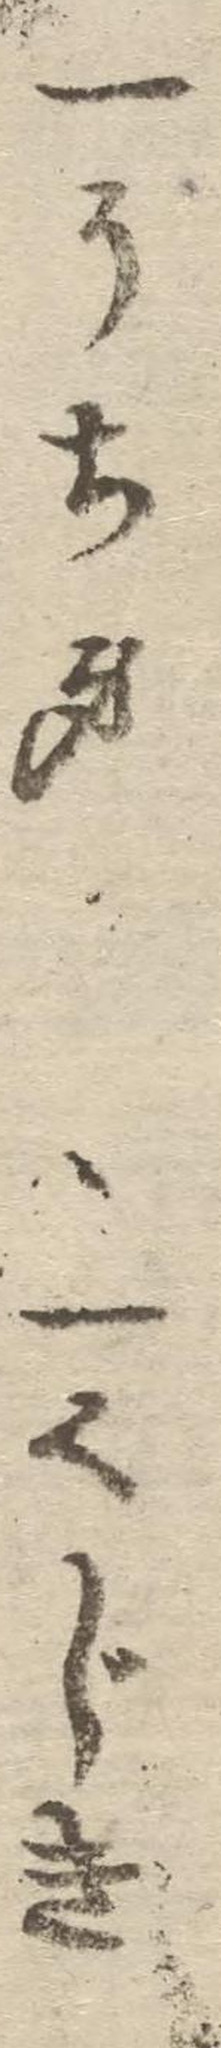一うち身一くじき
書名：浪華薬種問屋能書張交帖. 二
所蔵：国立国会図書館 National Diet Library, JAPAN
